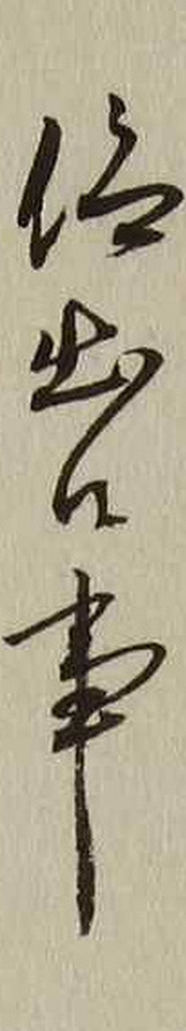仰出候事
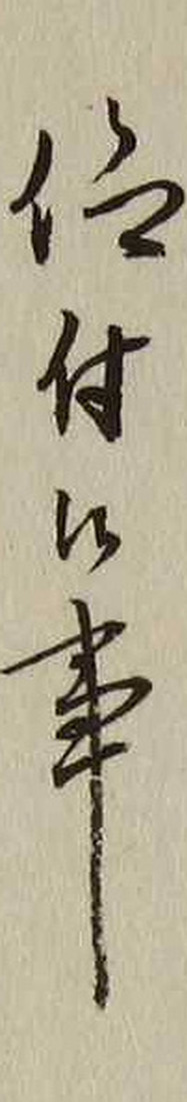仰付候事
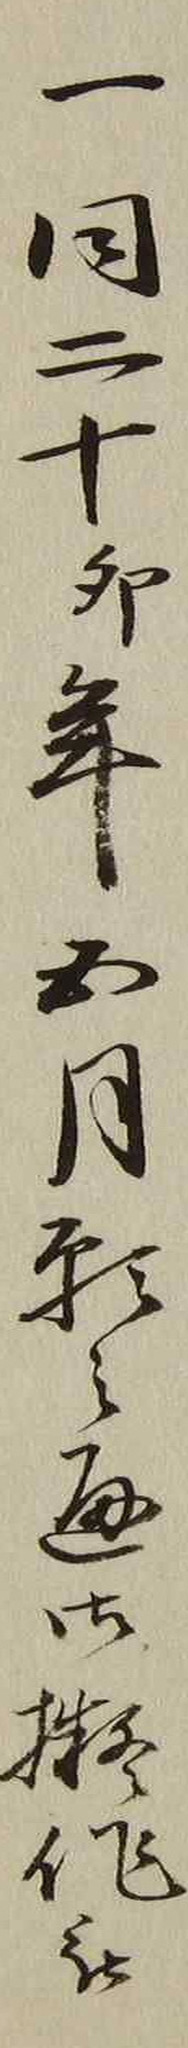一同二十卯年五月願之通御擬作被
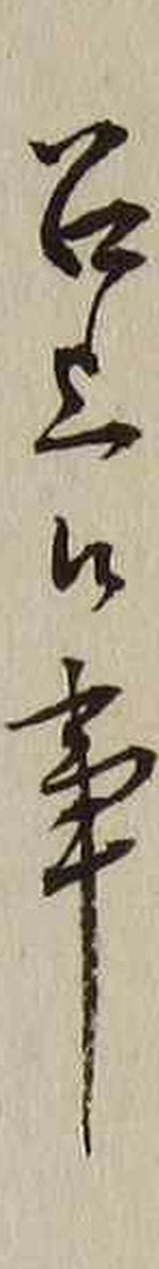召上候事
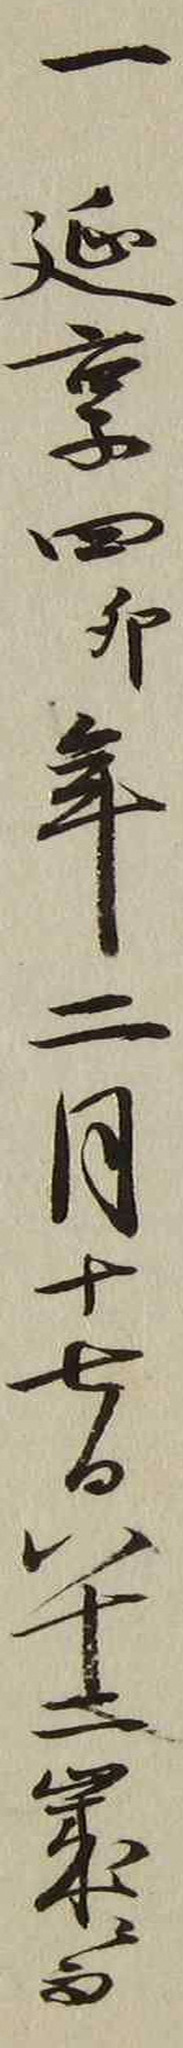一延享四卯年二月十七日八十二歳而
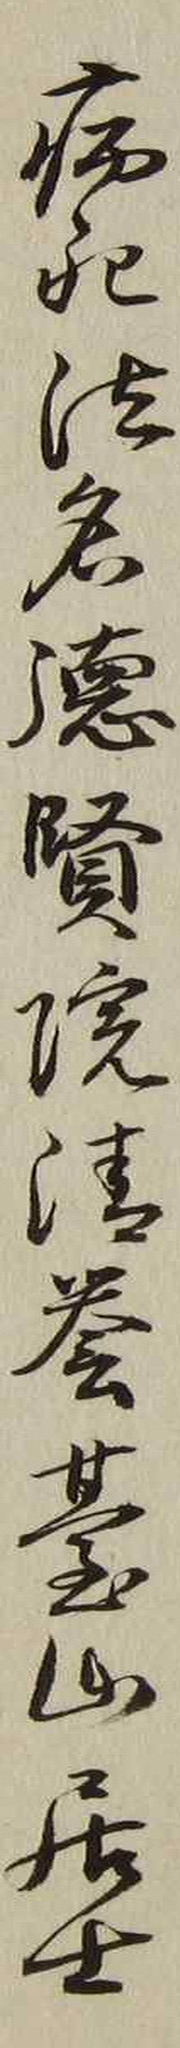病死法名徳賢院清誉台山居士
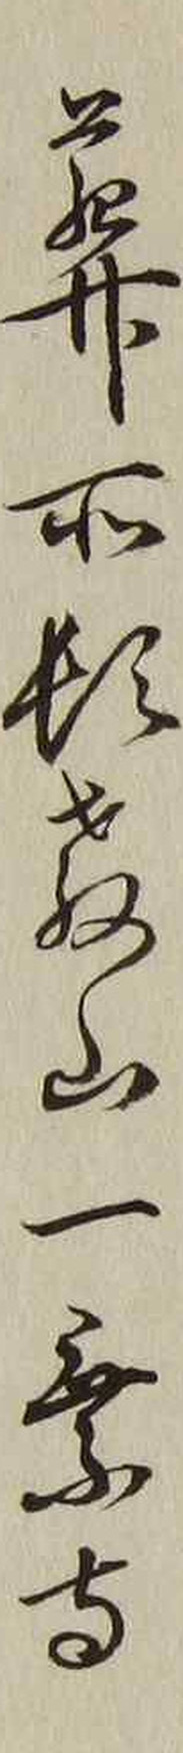葬所頓教山一乗寺

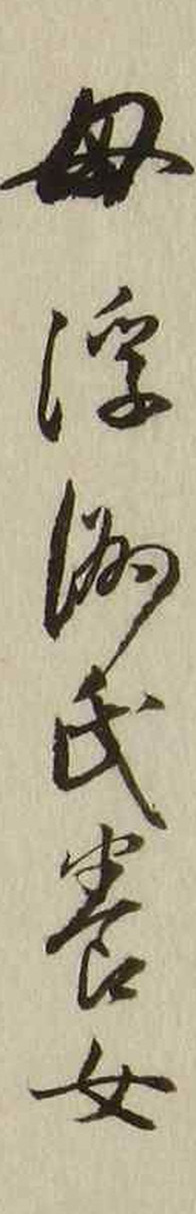母浮洲氏養女
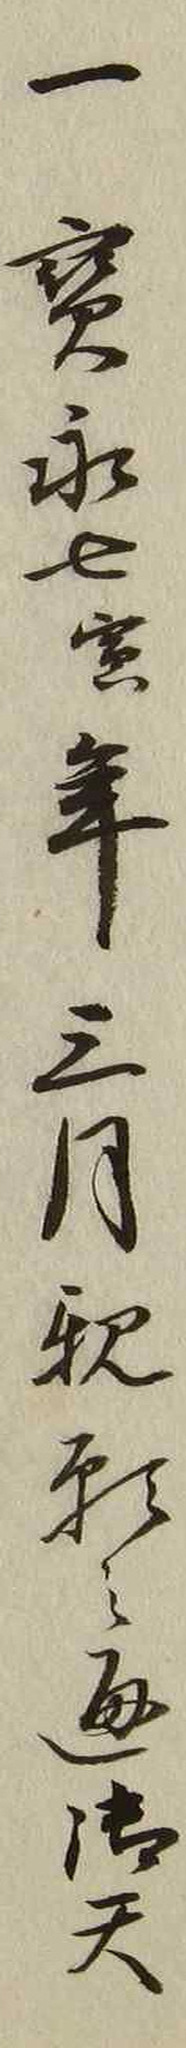一宝永七寅年三月親願之通御天
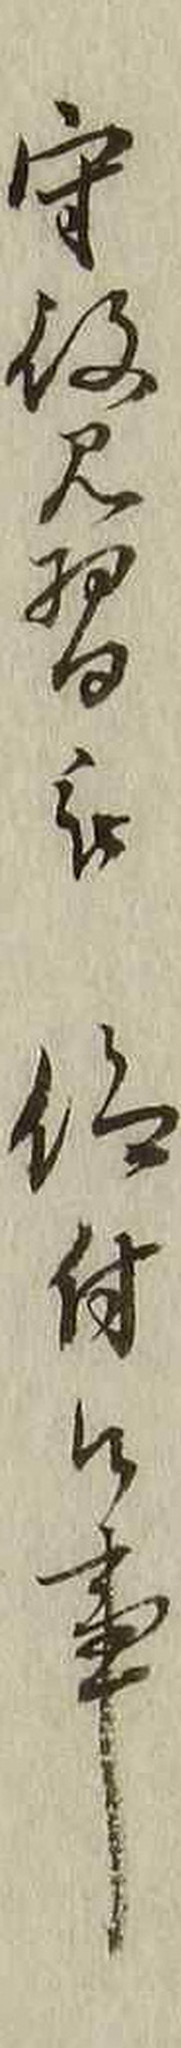守役見習被仰付候事
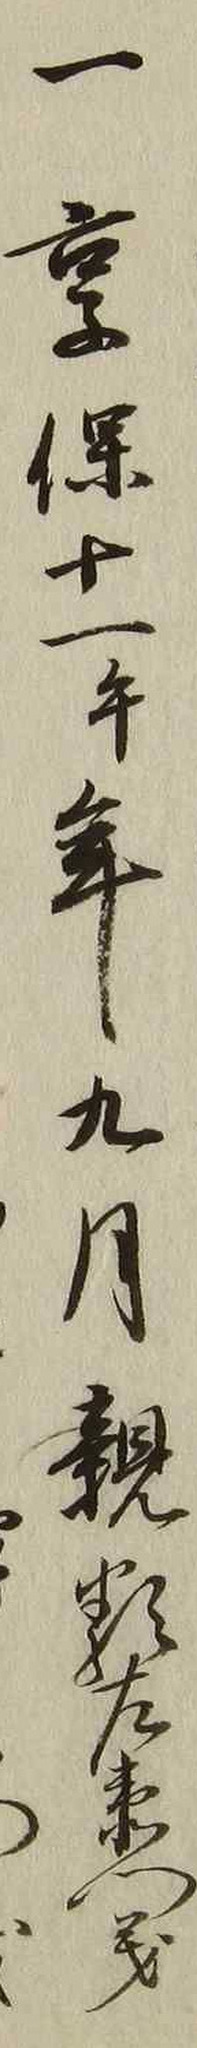一享保十一午年九月親類左衛門義
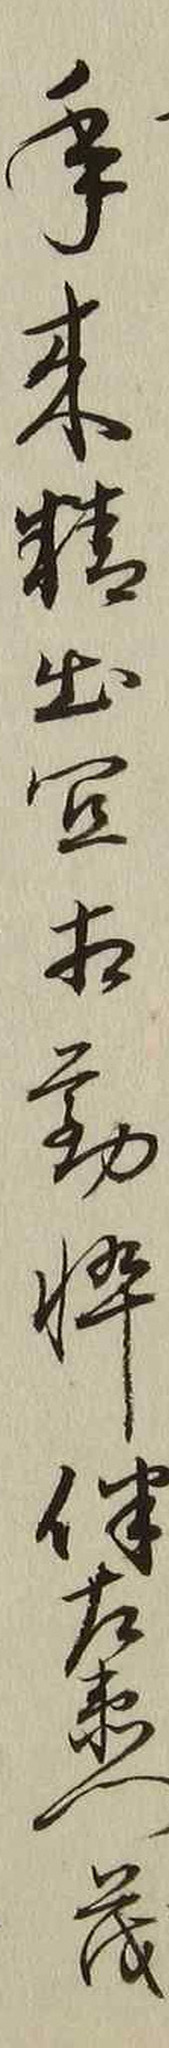年来精出宜相勤悴伴左衛門も
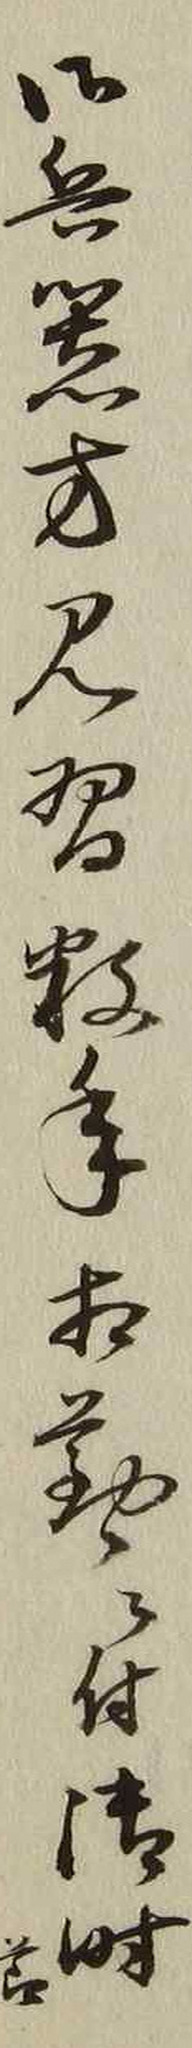御兵器方見習数年相勤候付御時節
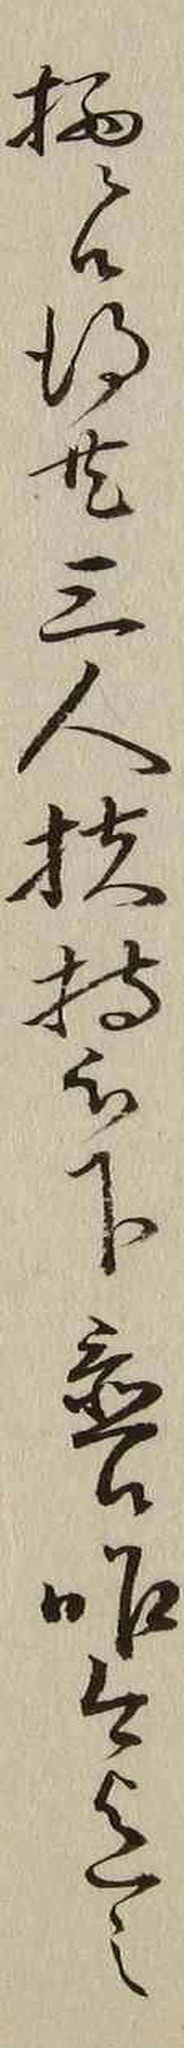柄ニ候得共三人扶持被下置候昨今迄之
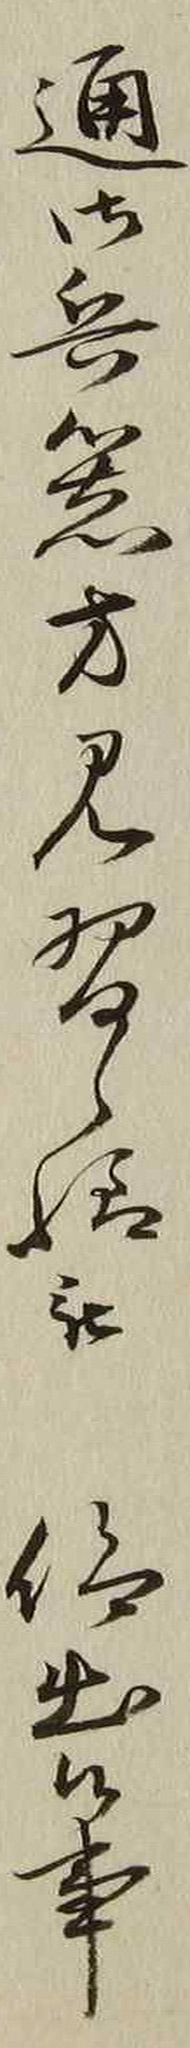通御兵器方見習候様被仰出候事
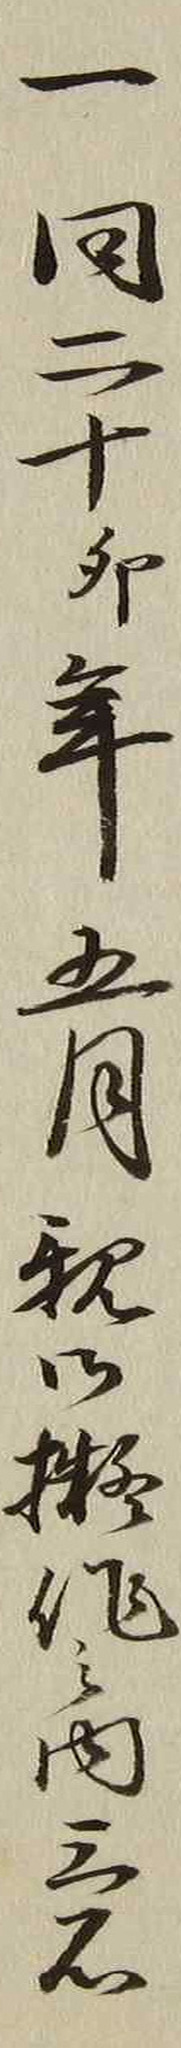一同二十卯年五月親御擬作之内三石
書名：諸士系譜　巻之102　か之部10
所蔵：会津若松市立会津図書館
